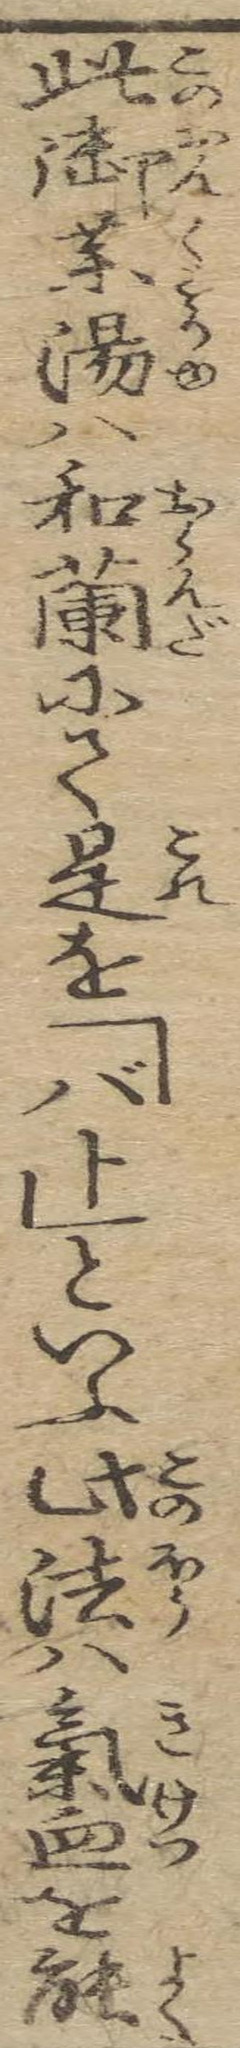此御薬湯は和蘭にて是を「バト」といふ此法は気血を能
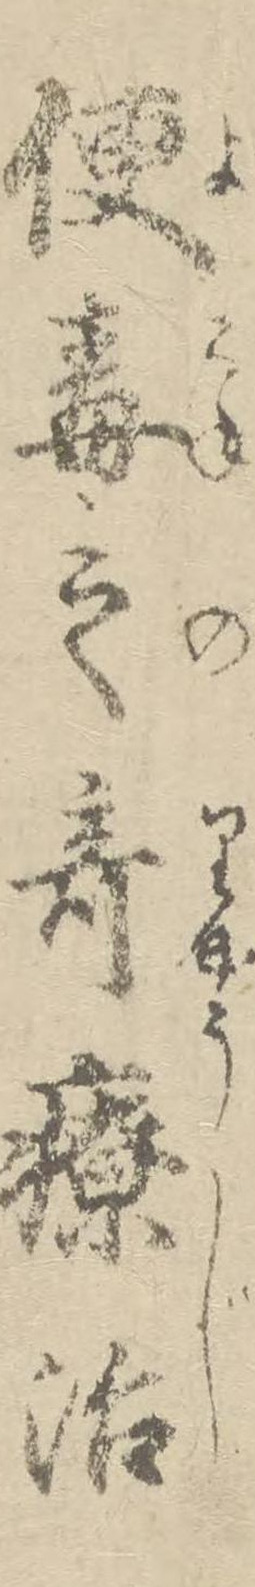便毒之奇療治
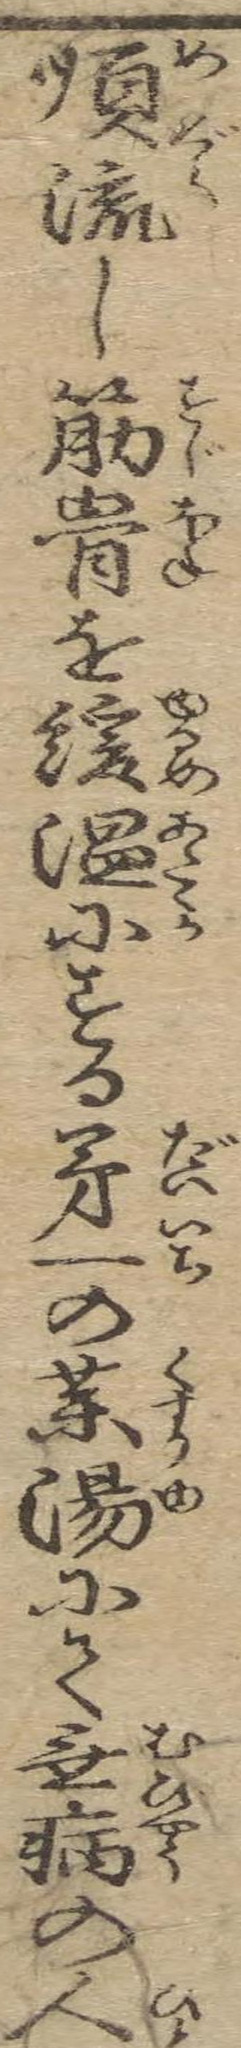順流し筋骨を緩温にする第一の薬湯にて無病の人
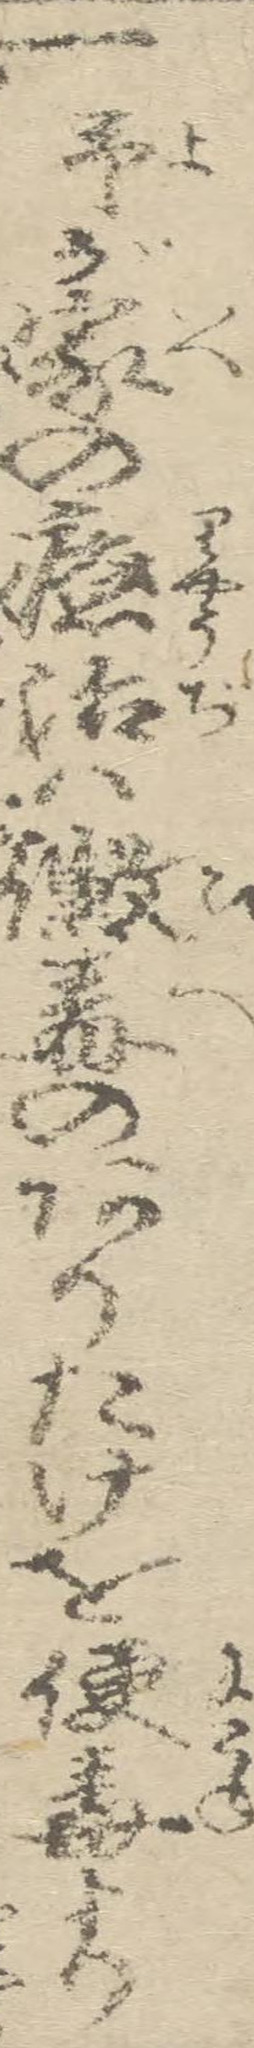一予が家の療治は黴毒のありたけを便毒より
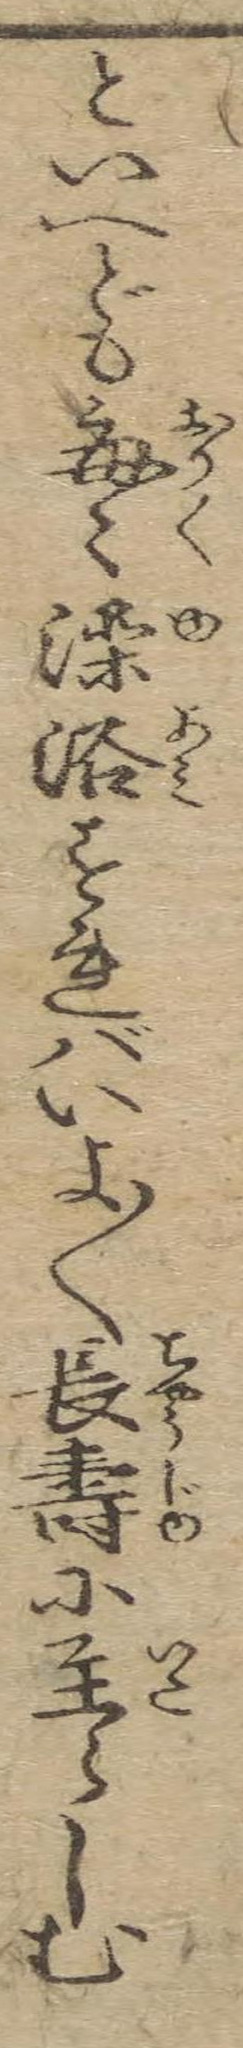といへども毎々澡浴すればいよ〳〵長寿に至らしむ
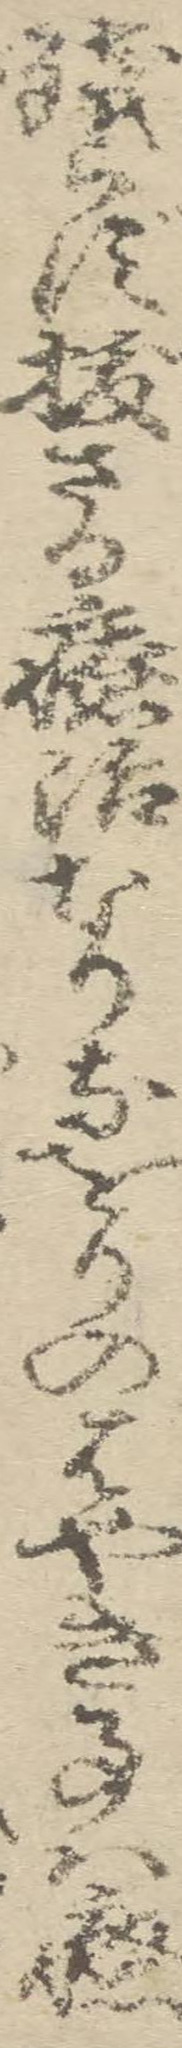残らず抜さる療治なりなをりのはやき事は療
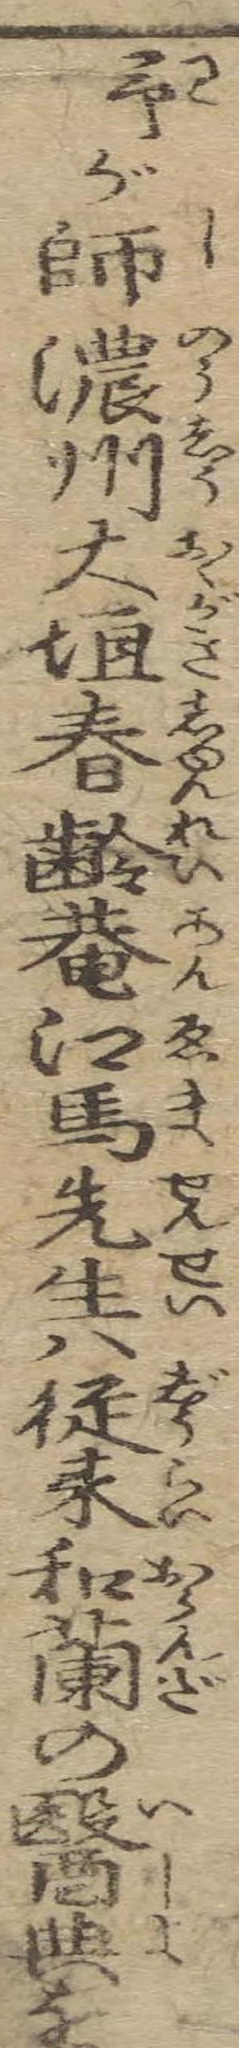予が師濃州大垣春齢庵江馬先生は従来和蘭の医典を
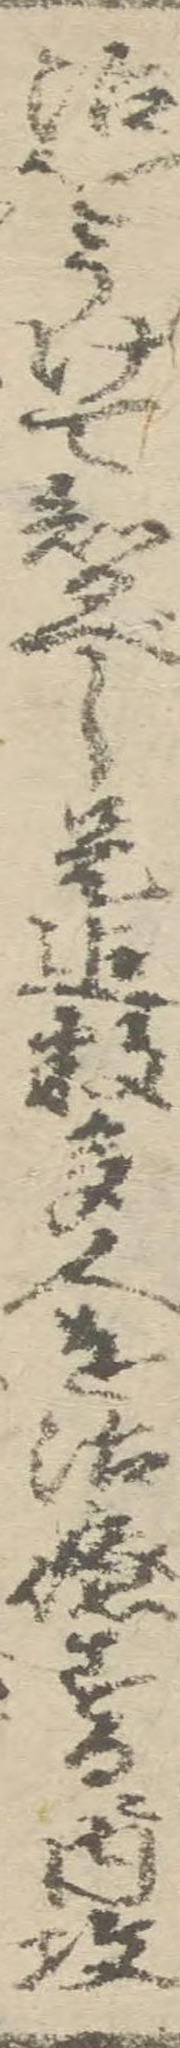治をうけて知るべし是迠数多人を治療するに内攻
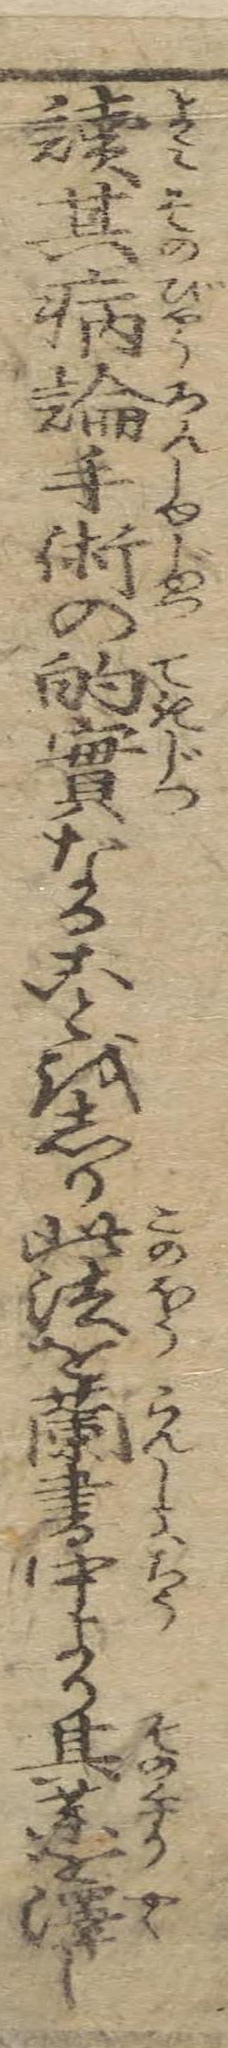読其病論手術の的実なることをしり此法を蘭書中より其薬を訳し
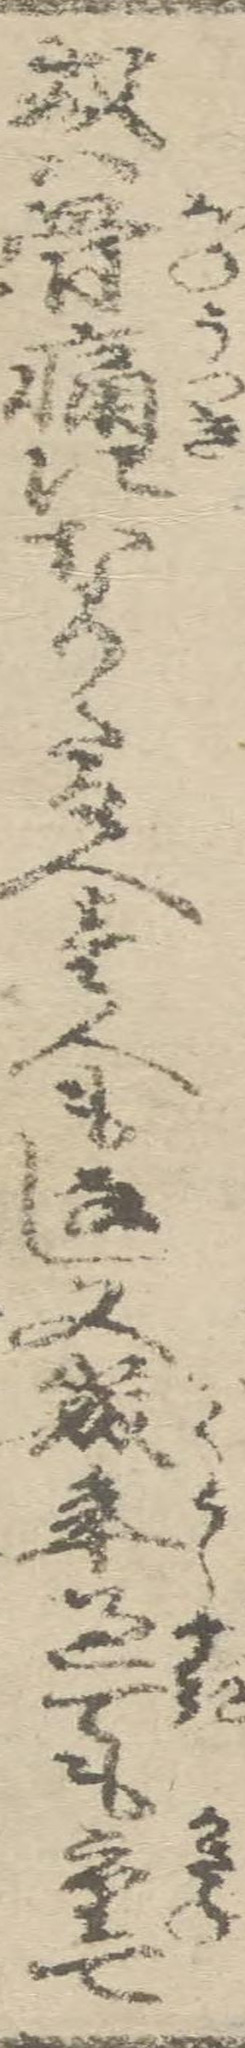或は骨痛になりたる人壱人もなし又幾年過ても重て
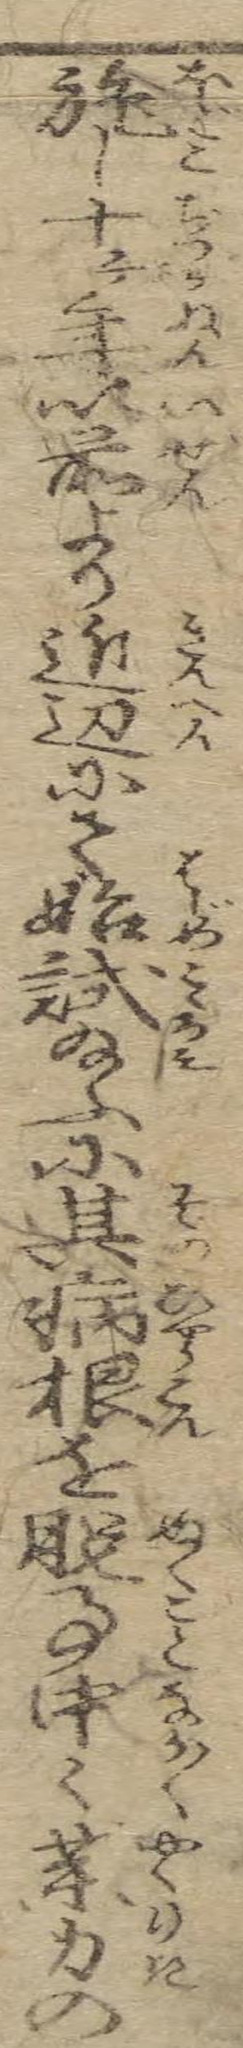施し十ケ年以前より近辺にて始試給ふに其病根を脱事中々薬力の
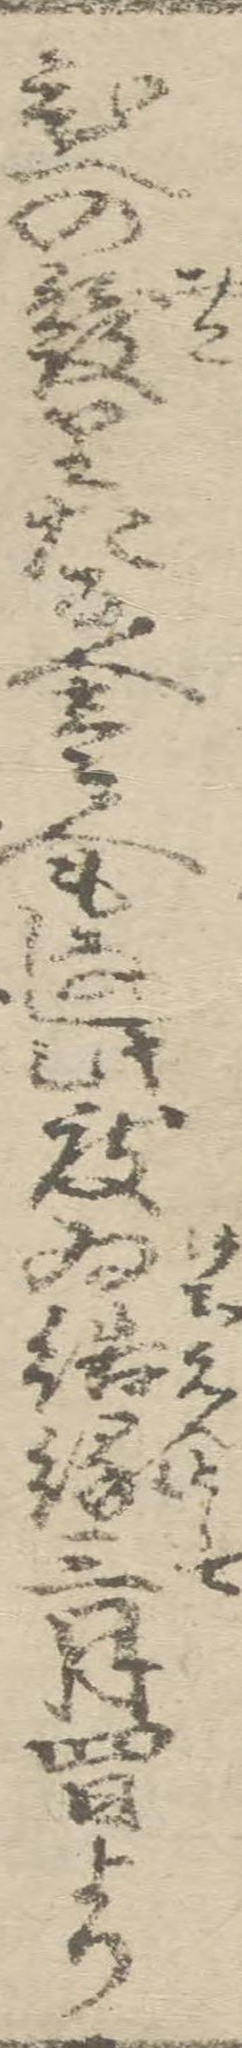ひへの発りたる人壱人もなし此度為結縁三月四日より
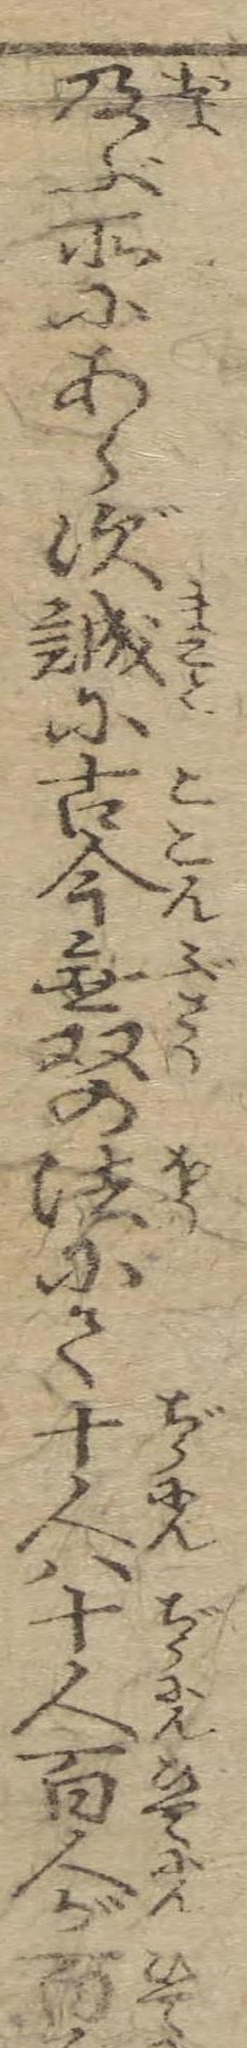及ぶ所にあらず誠に古今無双の法にて十人は十人百人が百人
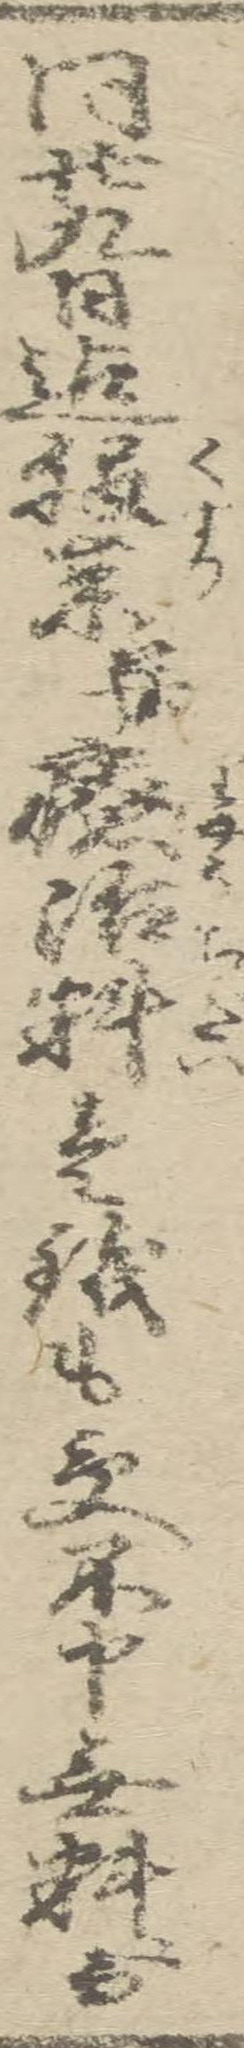同廿九日迠服薬并療治料壱銭も受不申無料に而
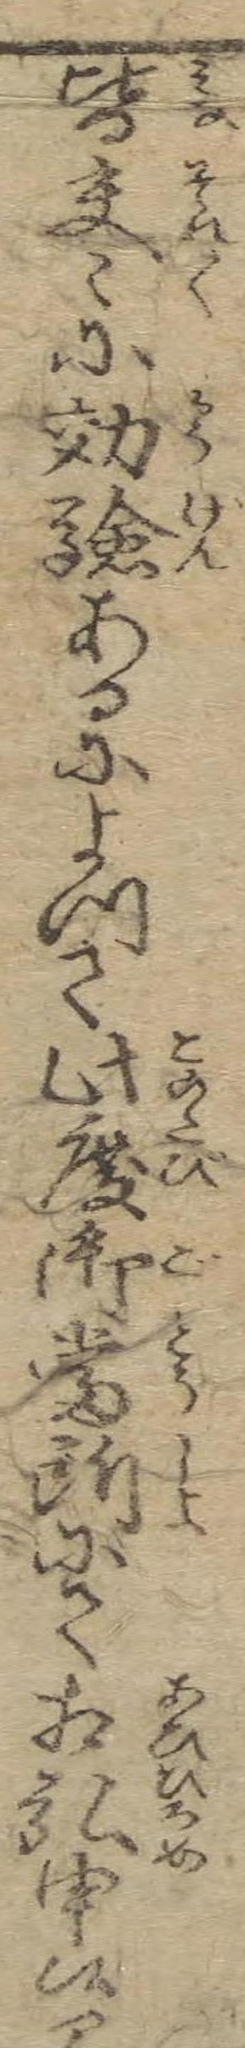皆夫々に効験あるによつて此度御当所にて相弘申候間
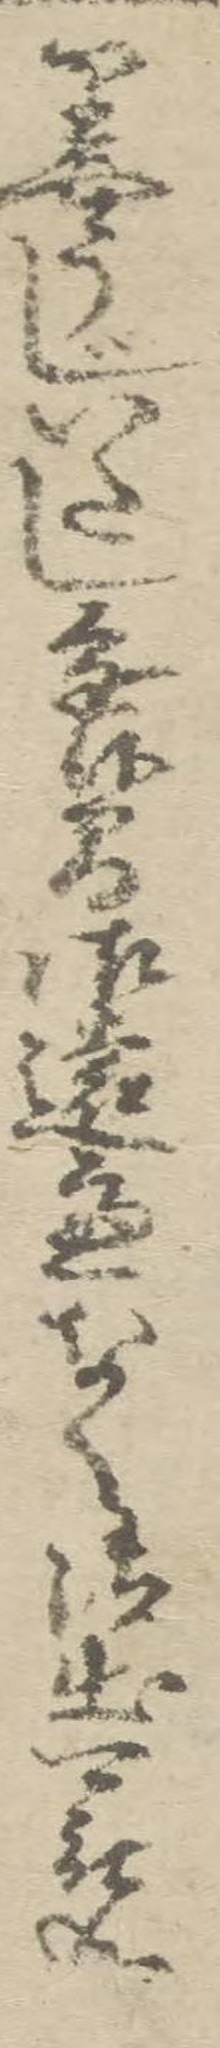りやうじいたし進候間御遠慮なく御出可被
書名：浪華薬種問屋能書張交帖. 二
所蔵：国立国会図書館 National Diet Library, JAPAN
